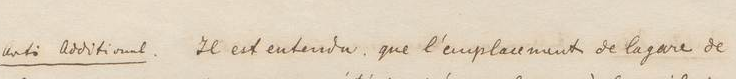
Art Additionel. Il es entendu, que l'emplacement de la gare de
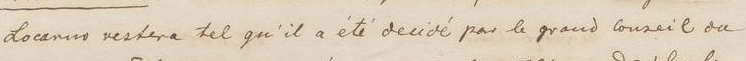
Locarno restera tel qu'il a été decidé par le grand conseil du
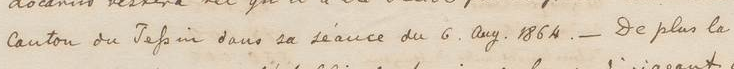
Canton du Tessin dans sa séance du 6. Aug. 1864. – De plus la
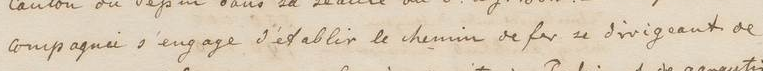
compagnie s'engage d'etablir le chemin de fer se dirigeant de
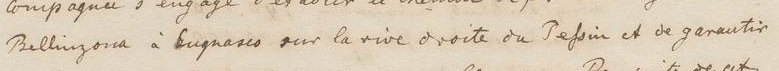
Bellinzona à Gugnasco sur la rive droite du Tessin et de garantir
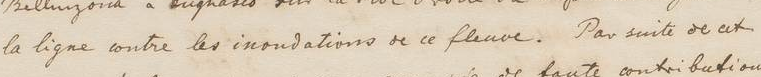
la ligne contre les inondations de ce fleuve. Par suite de cet
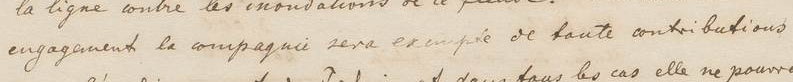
engagement la compagnie sera exempté de toute contribution
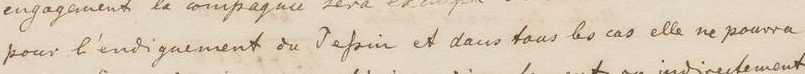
pour l'endiguement du Tessin et dans tous les cas elle ne pourra
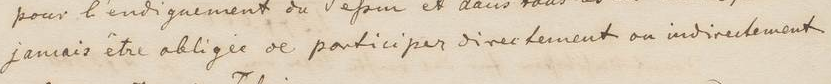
jamais être obligée de participer directement ou indirectement
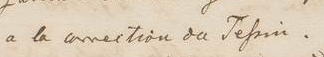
a la correction du Tessin.
